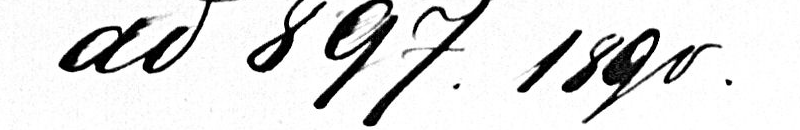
ad 897. 1890.
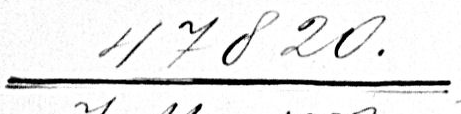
47820.
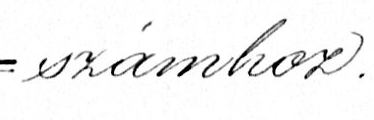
számhoz.
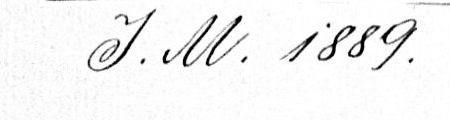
J.M. 1889.
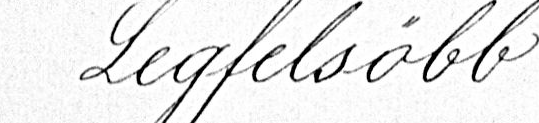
Legfelsöbb
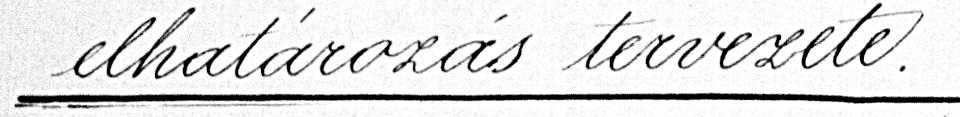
elhatározás tervezete.
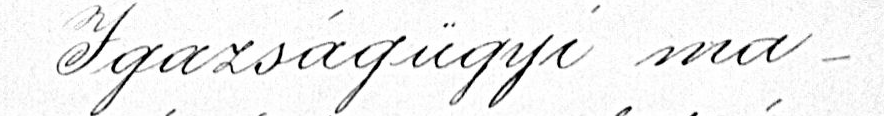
Igazságügyi ma¬
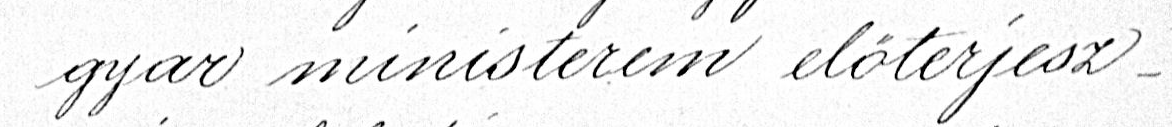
gyar ministerem elöterjesz¬
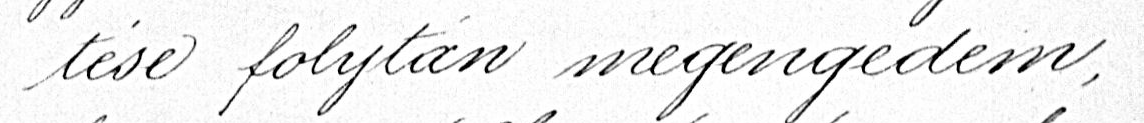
tése folytán megengedem,
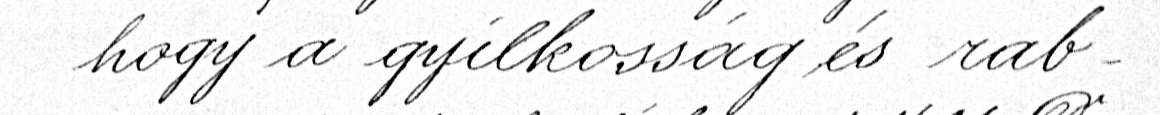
hogy a gyilkosság és rab¬
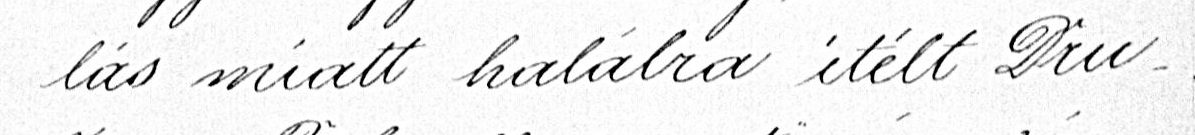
lás miatt halálra itélt Dru¬
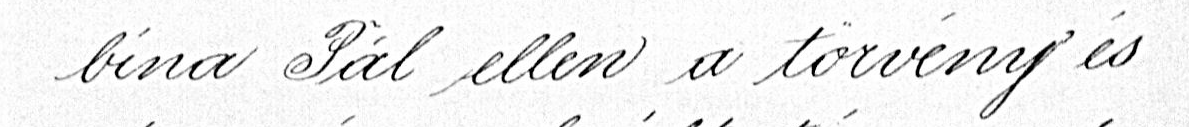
bina Pál ellen a törvény és
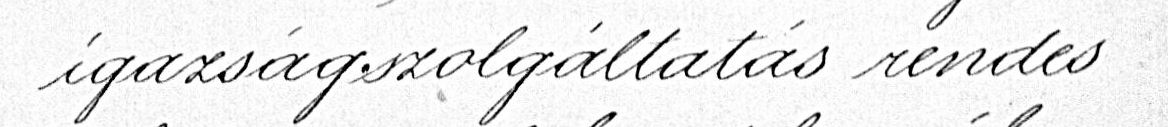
igazságszolgáltatás rendes
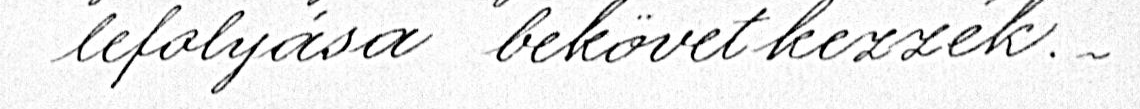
lefolyása bekövetkezzék.-
